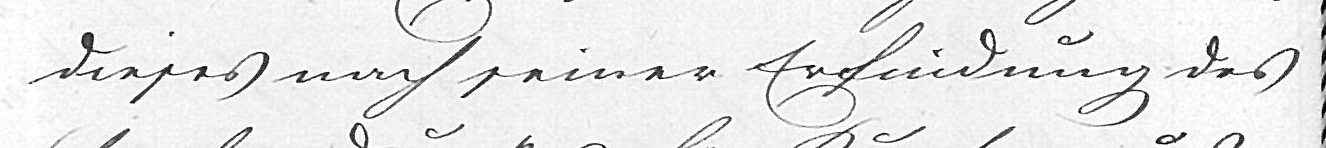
dieses nach seiner Erfindung des
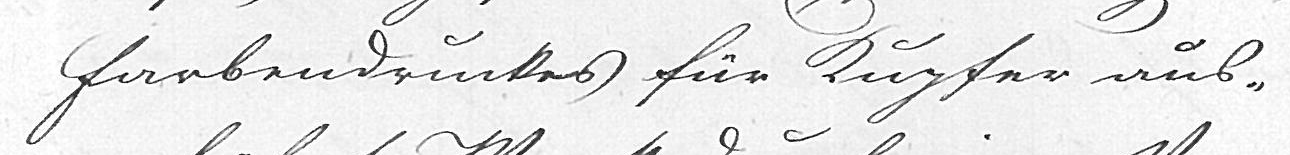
Farbendruckes für Kupfer aus-
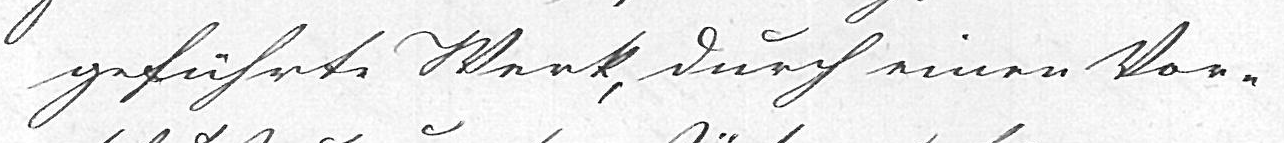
geführte Werk, durch einen Vor-
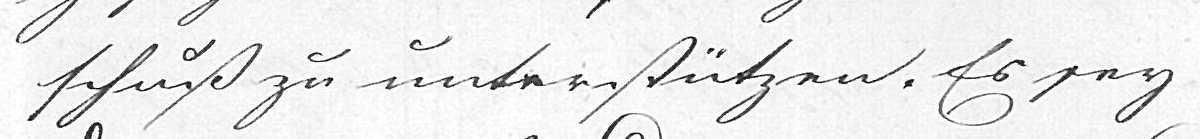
schuß zu unterstützen. Es sey
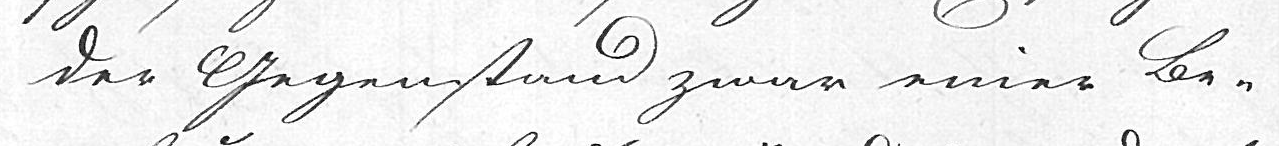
der Gegenstand zwar einer Be-
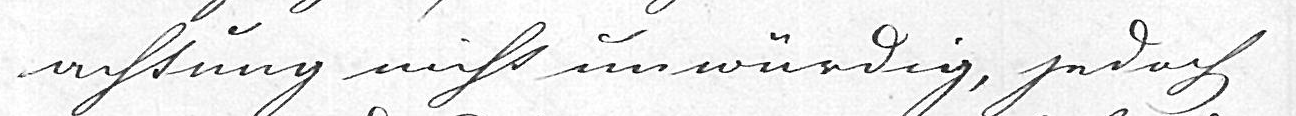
achtung nicht unwürdig, jedoch
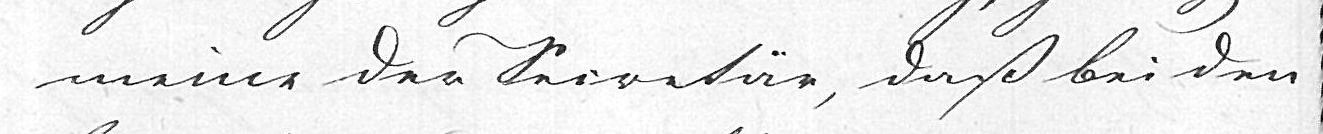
meine der Secretär, daß bei den
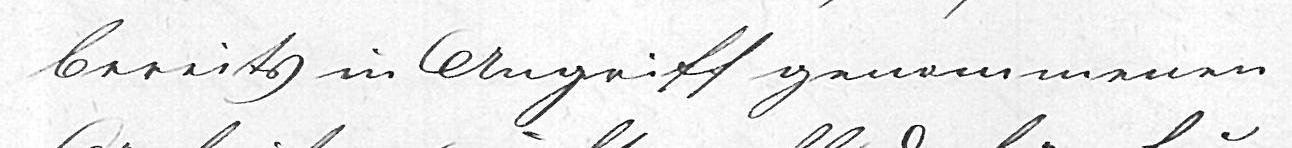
bereits in Angriff genommenen
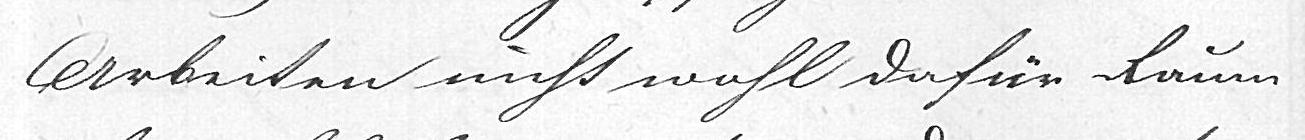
Arbeiten nicht wohl dafür Raum
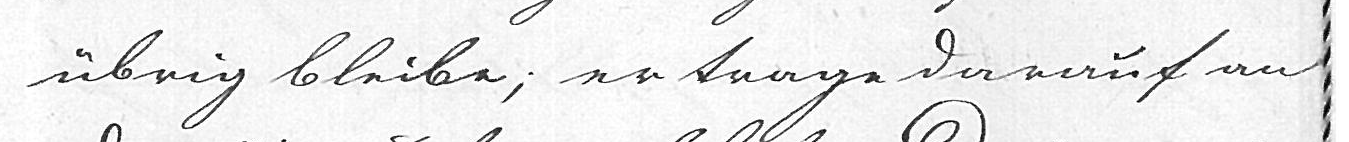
übrig bleibe; er trage darauf an
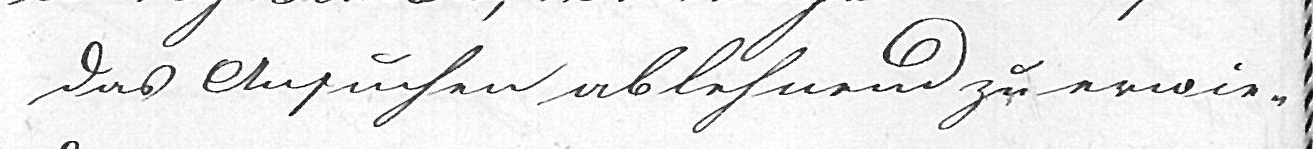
das Ansuchen ablehnend zu erwie-
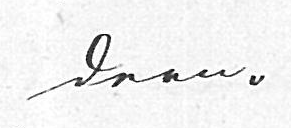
dern.
